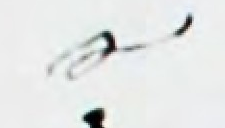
s
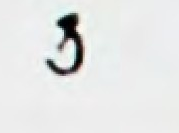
3
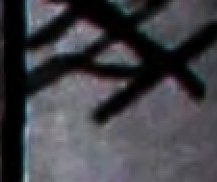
471
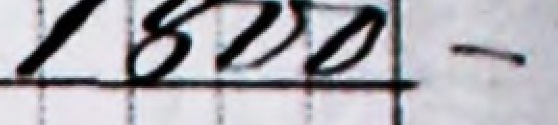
1800 -
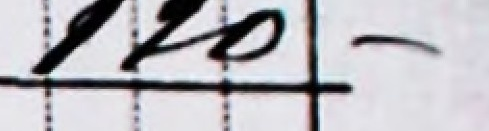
120 -
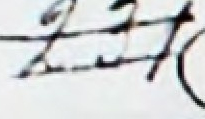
231
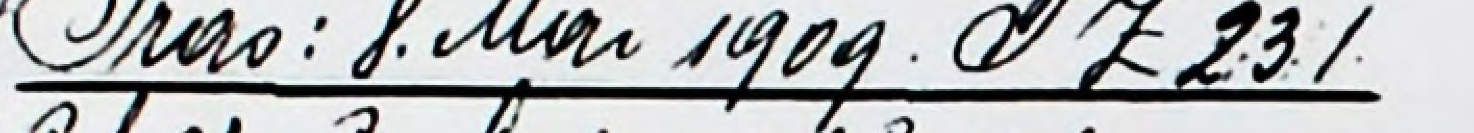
Präs: 8. Mai 1909. T Z 231.
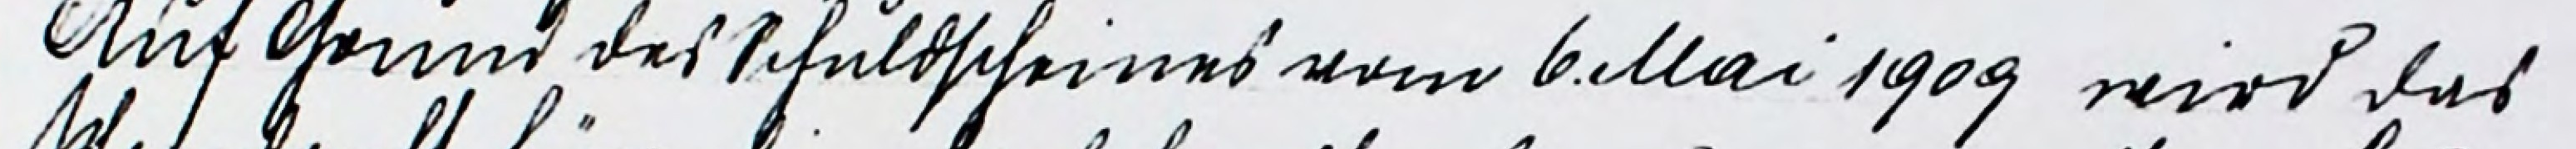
Auf Grund des Schuldscheines vom 6. Mai 1909 wird das
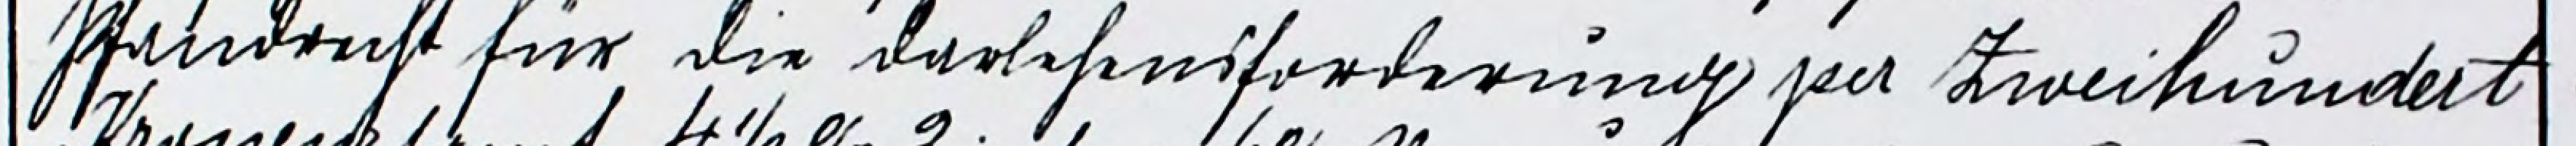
Pfandrecht für die Darlehensforderung per Zweihundert
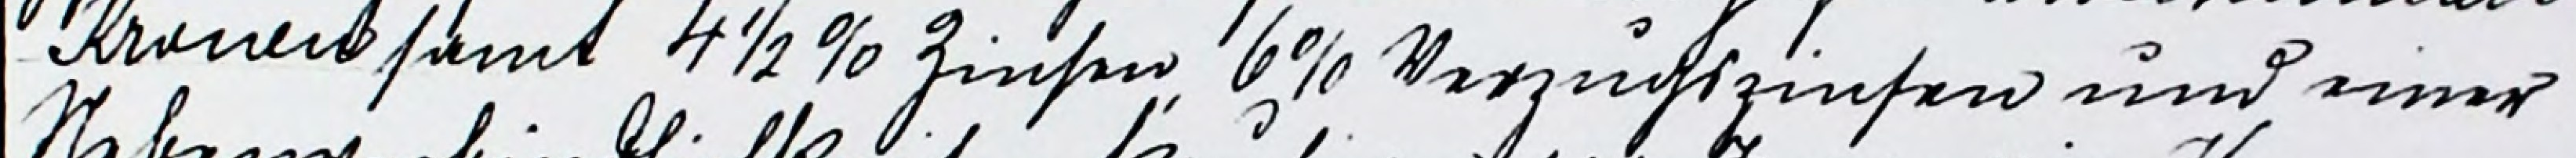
Kronen samt 4 1/2 % Zinsen 6 % Verzugszinsen und einer
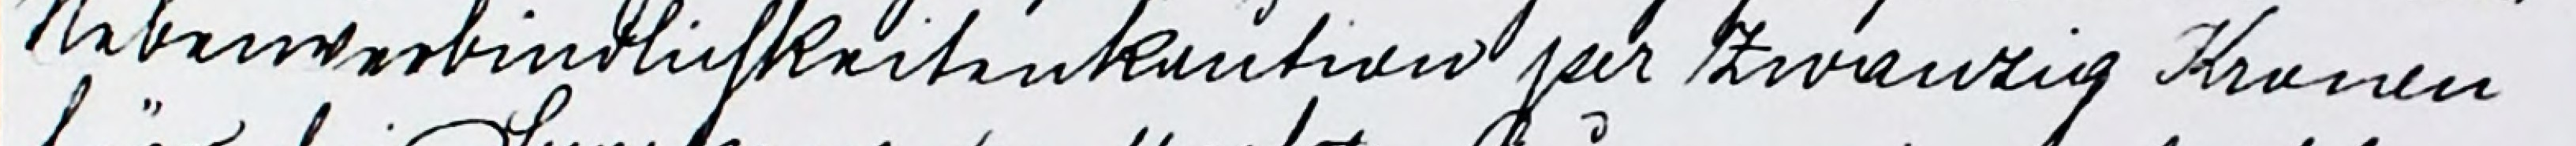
Nebenverbindlichkeitenkaution per Zwanzig Kronen
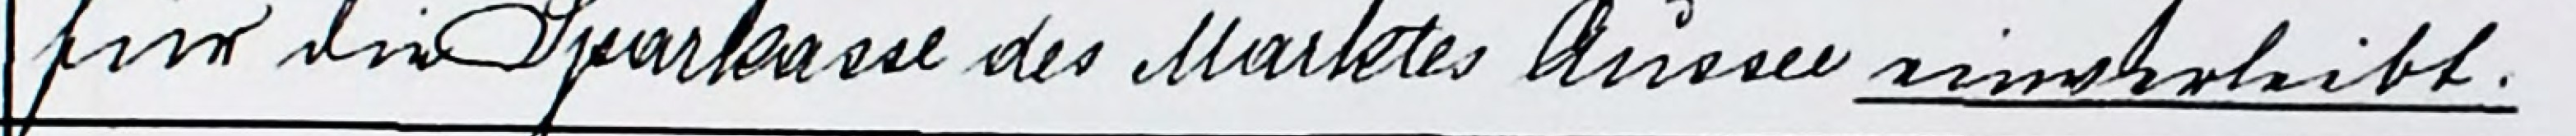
für die Sparkasse des Marktes Aussee einverleibt.
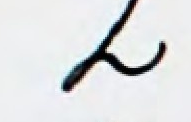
2
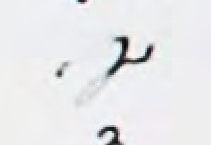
s
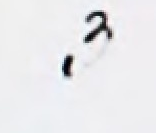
3
